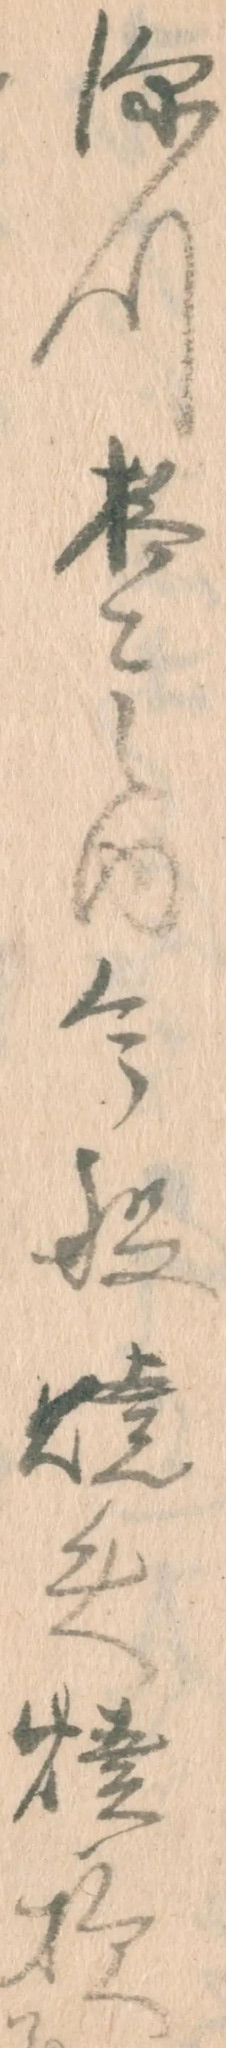深川橋々之内今般焼失焼損并
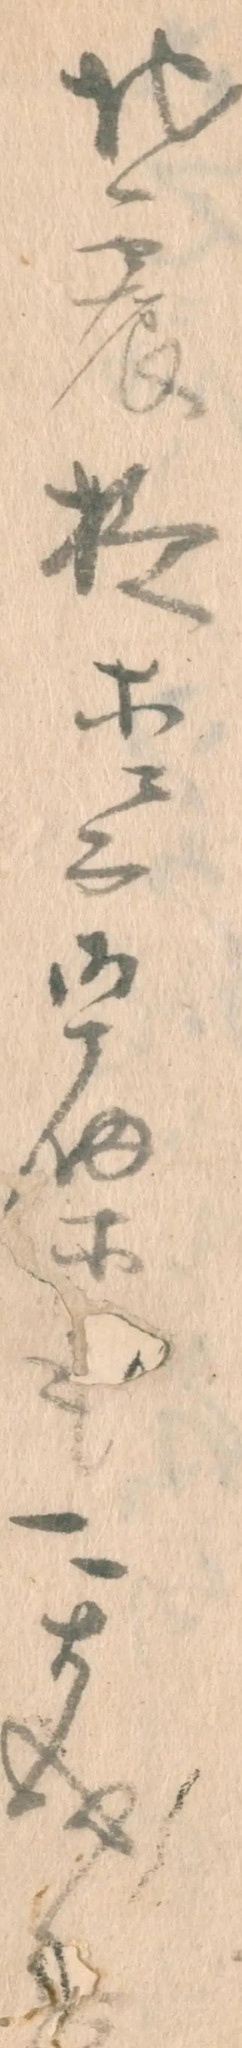地震損等ニ而御届等出し可相成

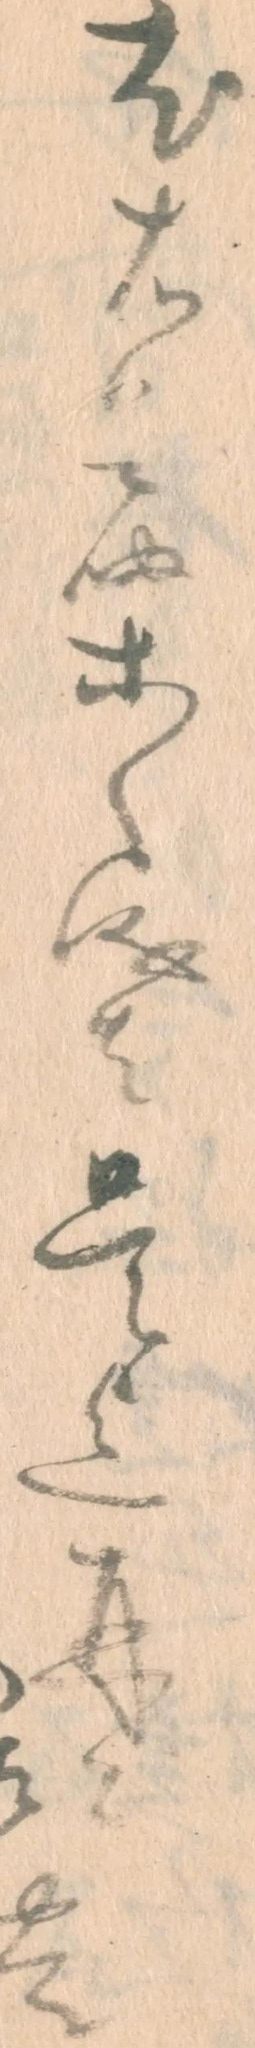尤右御届等之儀は是迄再々御相談
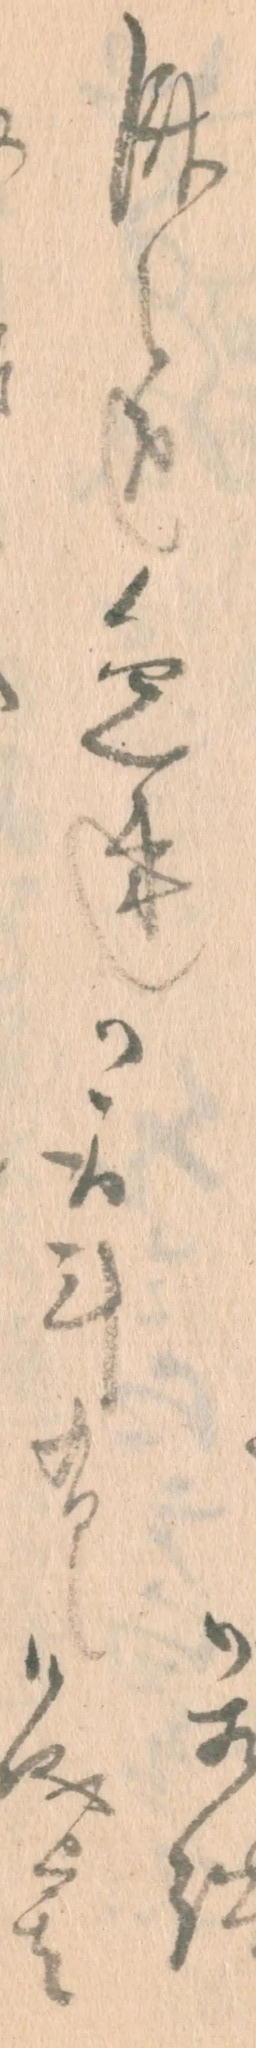済之通急速御取計有之候儀とは
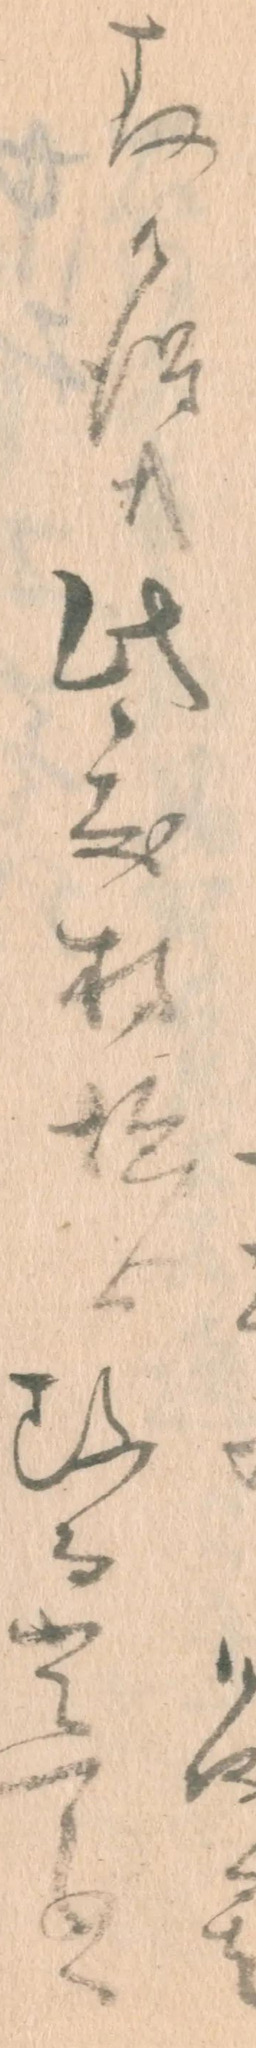存候得共此度村垣ゟ改而と可然
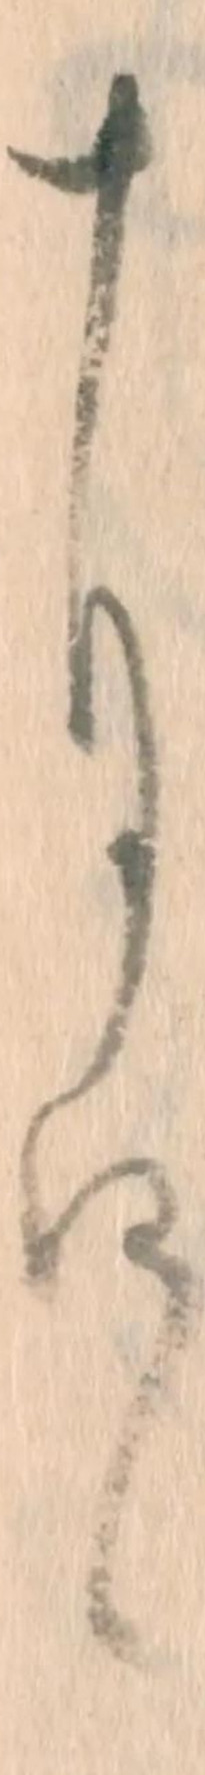十月四日
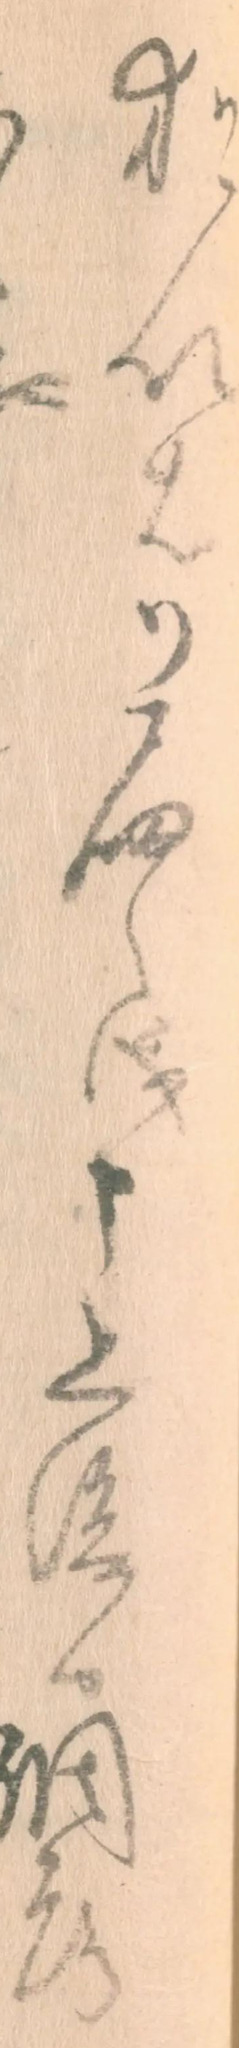猶以右御届之儀申上後御調落
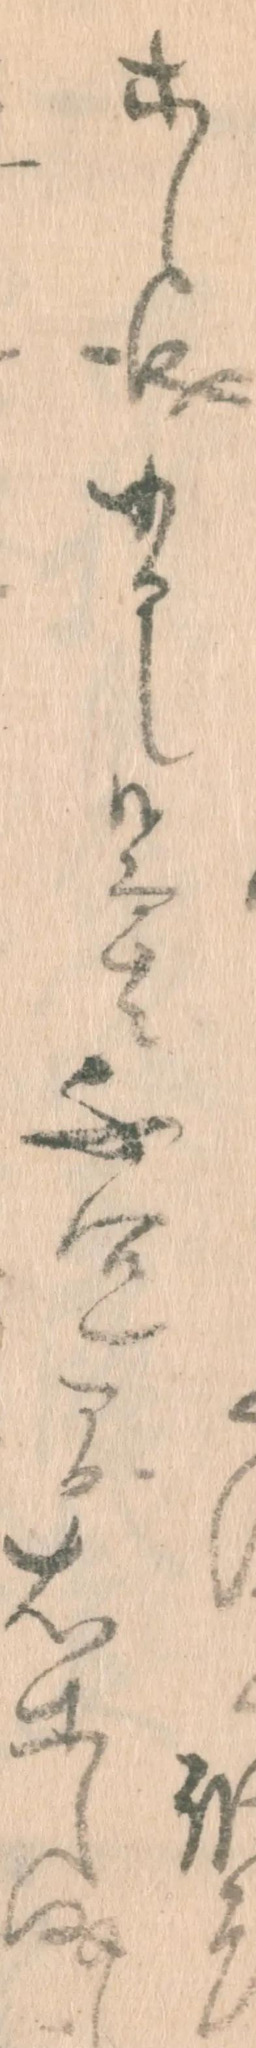等之儀有之候而は不宜敷右等之儀も
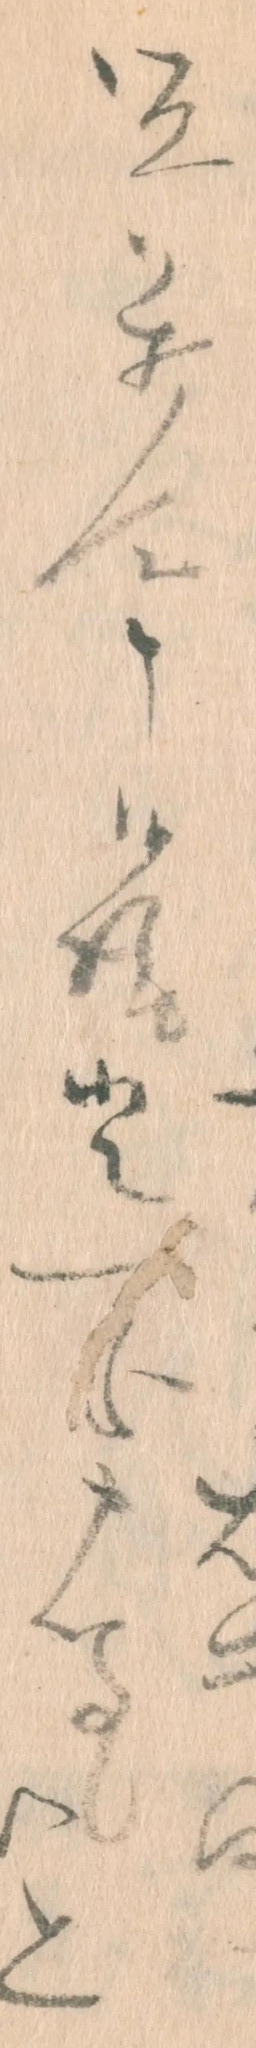宜御打合申候様と可被申聞候以上

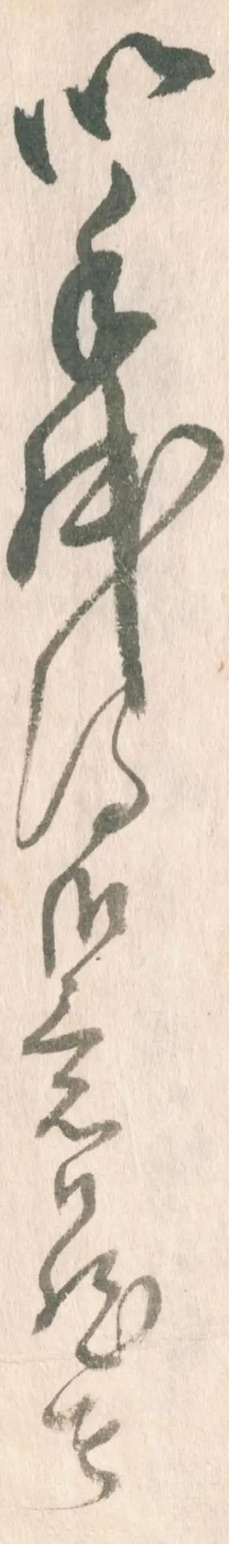以手紙得御意候然は
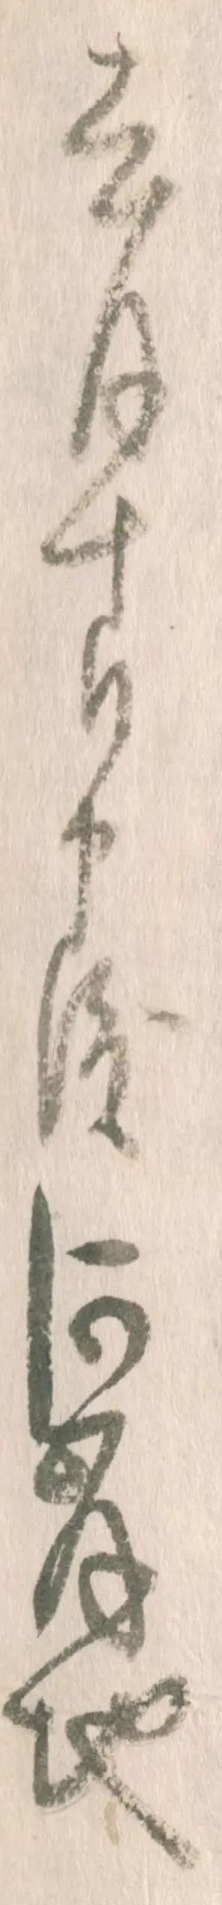去月十日申渡河岸地
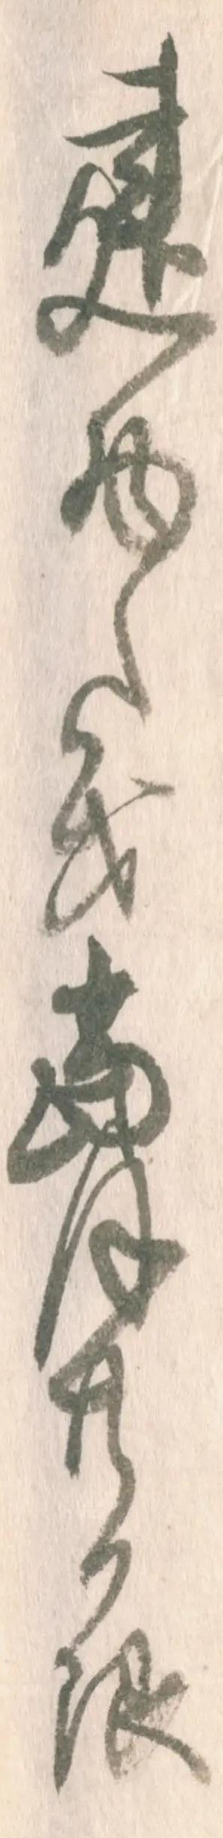建物之義当月廿日限
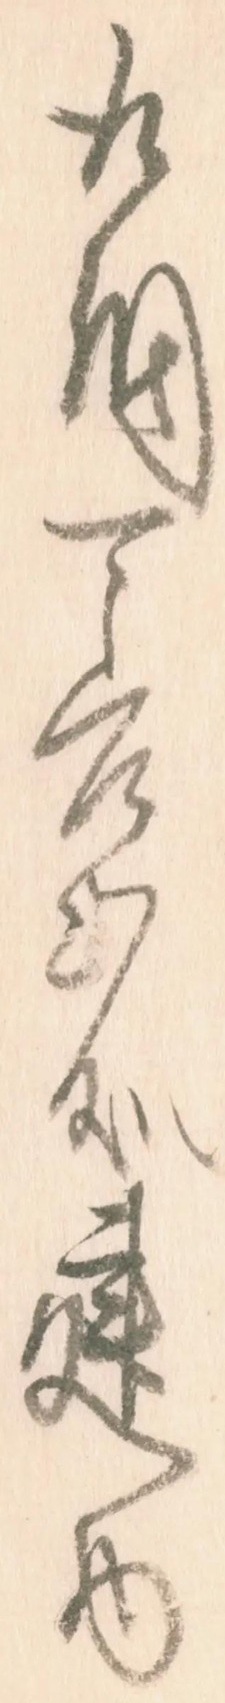取調可差出処建物
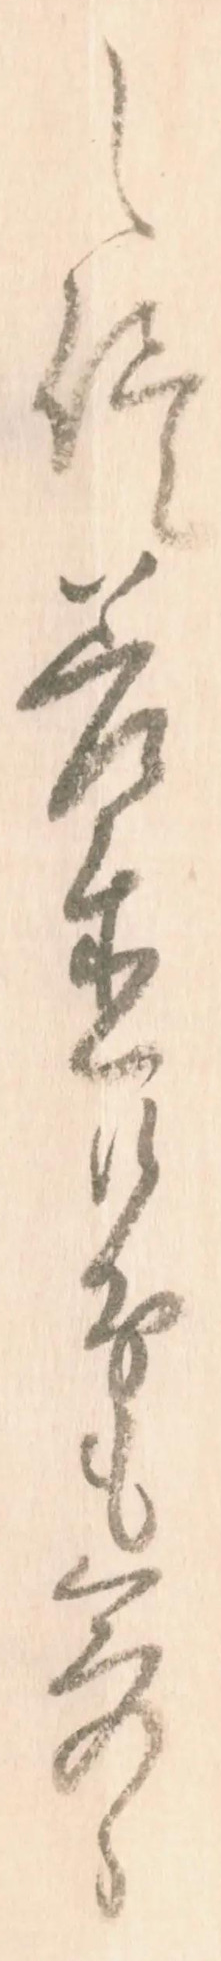之儘差置候分も多く
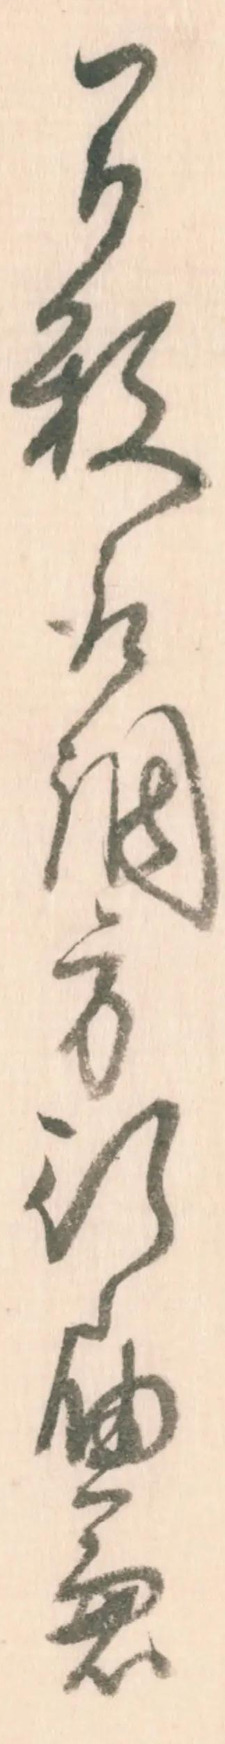間数取調方行届兼
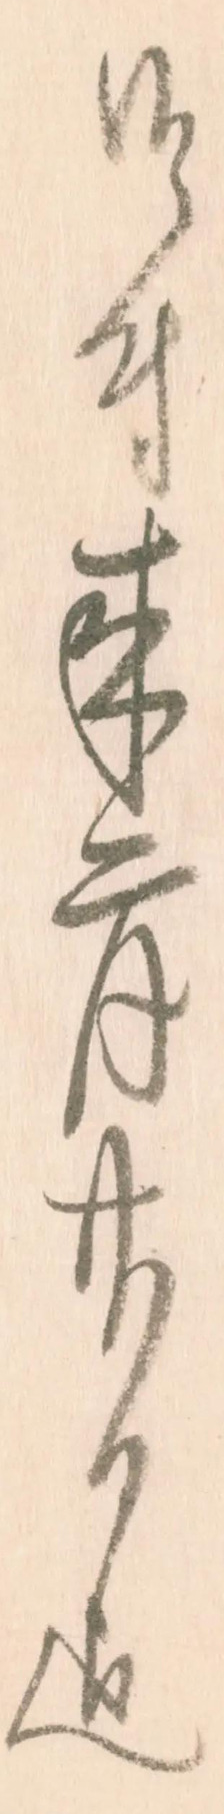候ニ付来二月廿日迄
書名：地震災書留 2巻. [1] 内表紙に「地震災書留　安政二卯年　但本所深川御用屋敷地代免除調」とあり
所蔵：国立国会図書館 National Diet Library, JAPAN
